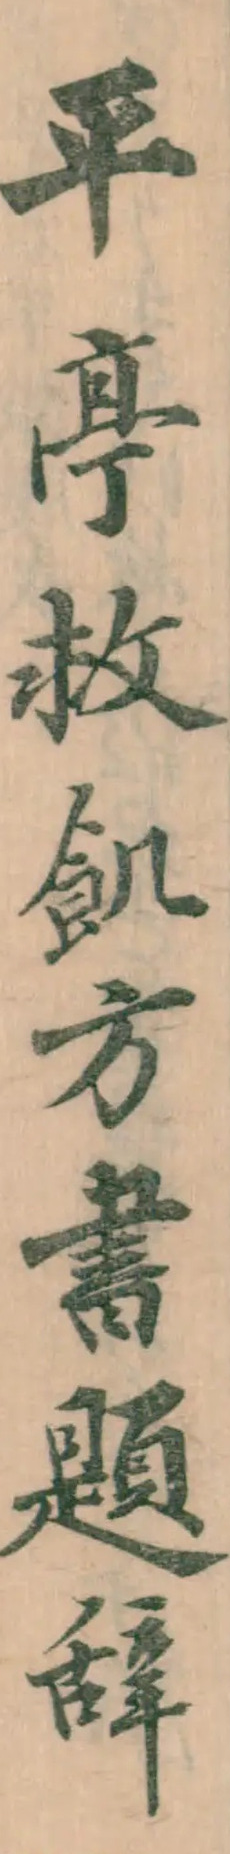平亭救飢方書題辞
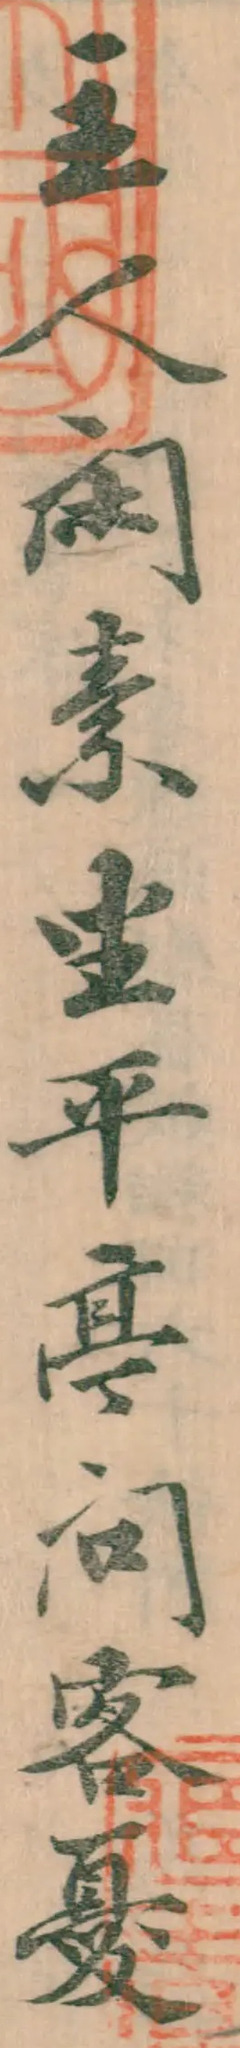主人閑素坐平亭問客憂
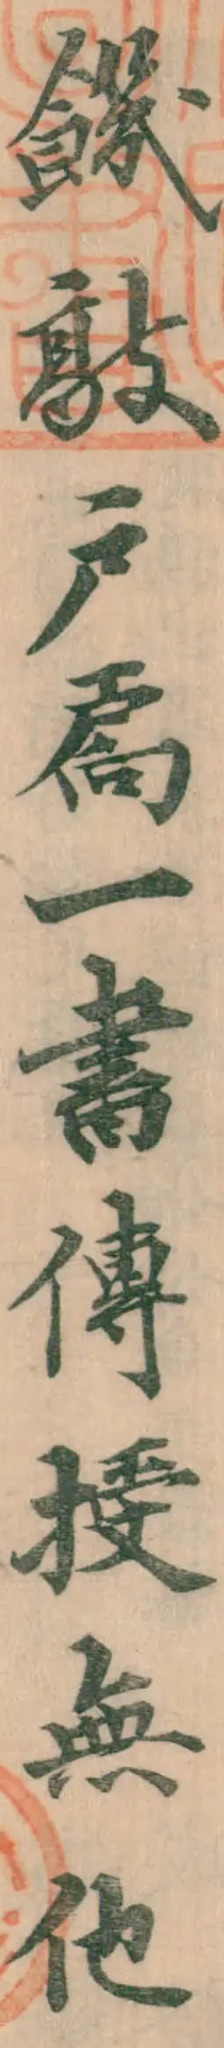饑敲戸扄一書伝授無他
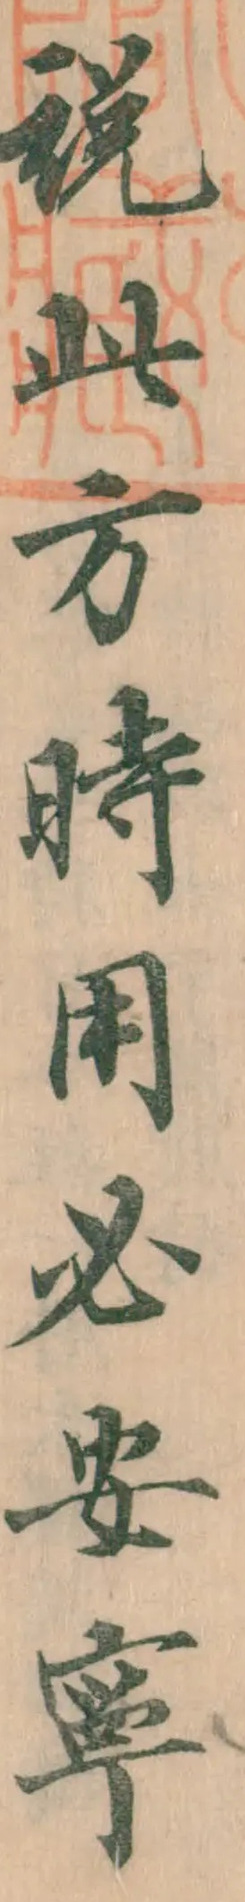説此方時用必安寧
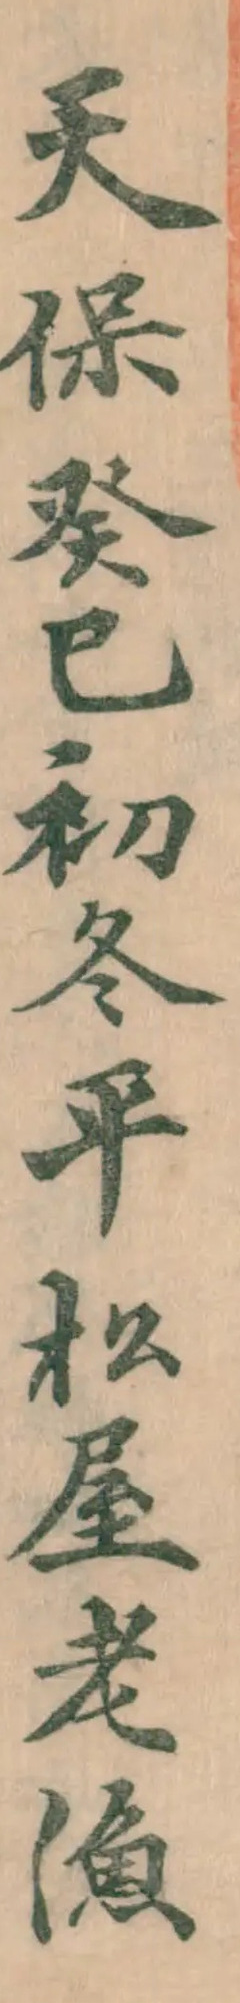天保癸巳初冬平松屋老漁
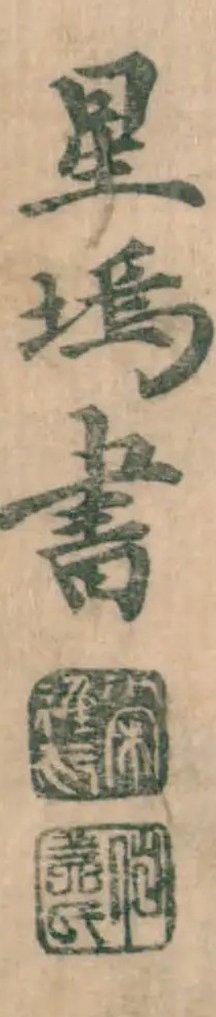星塢書

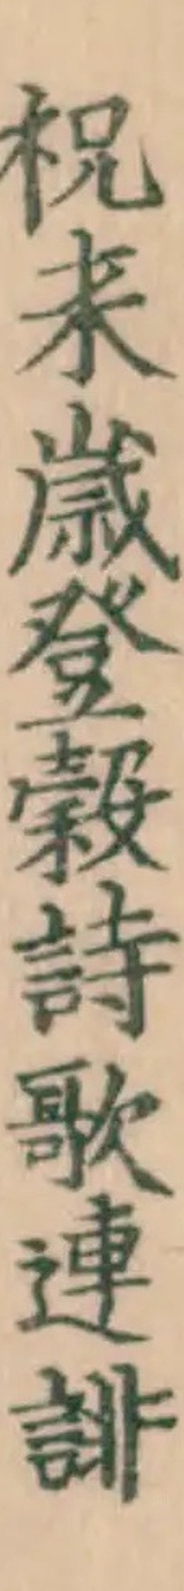祝来歳登穀詩歌連誹
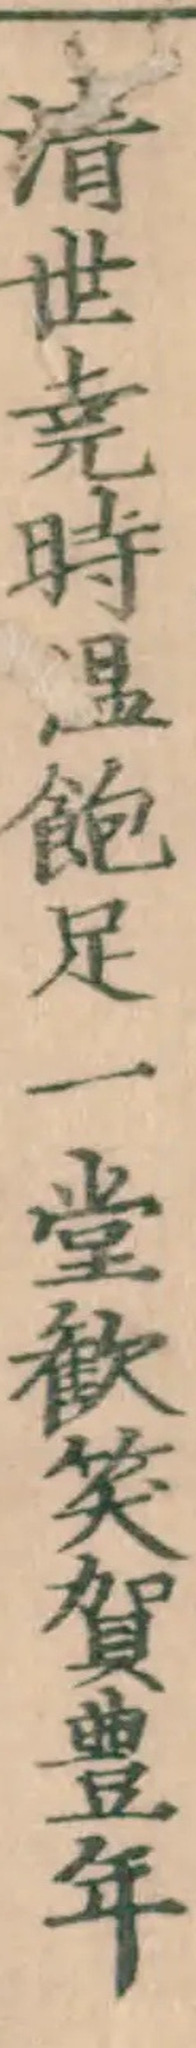清世尭時温飽足一堂歓笑賀豊年鷲山
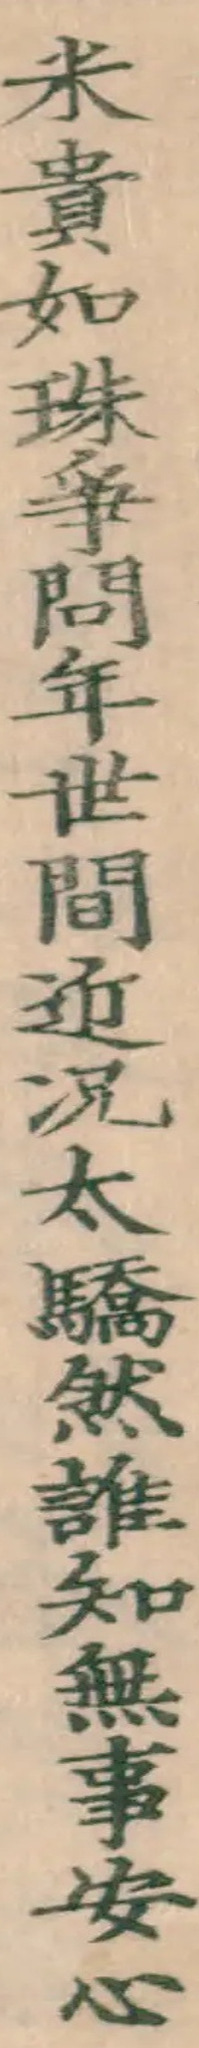米貴如珠争問年世間近況太驕然誰知無事安心柳涯
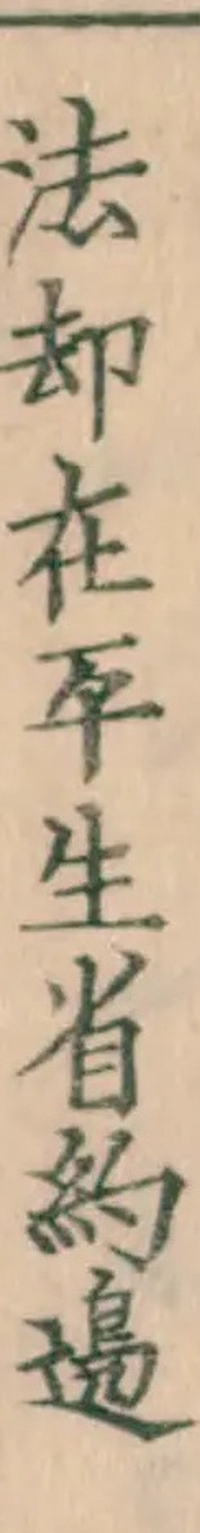法却在平生省約辺
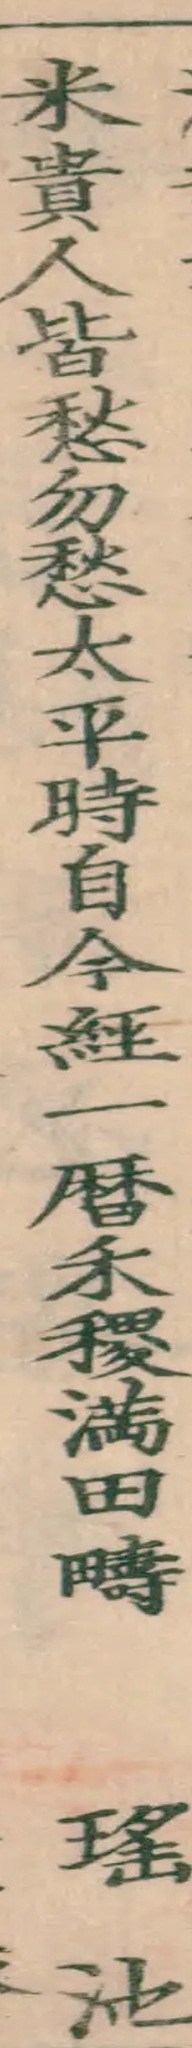米貴人皆愁勿愁太平時自今経一暦禾稷満田疇瑶池
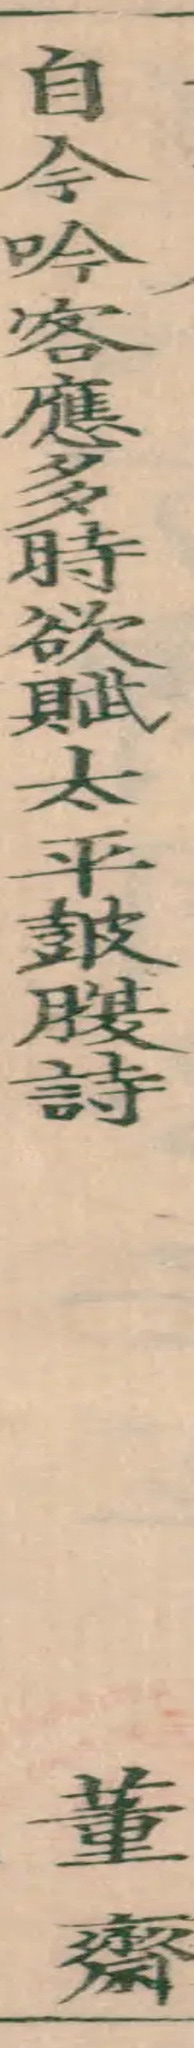自今吟客應多時欲賦太平鼓腹詩董斎
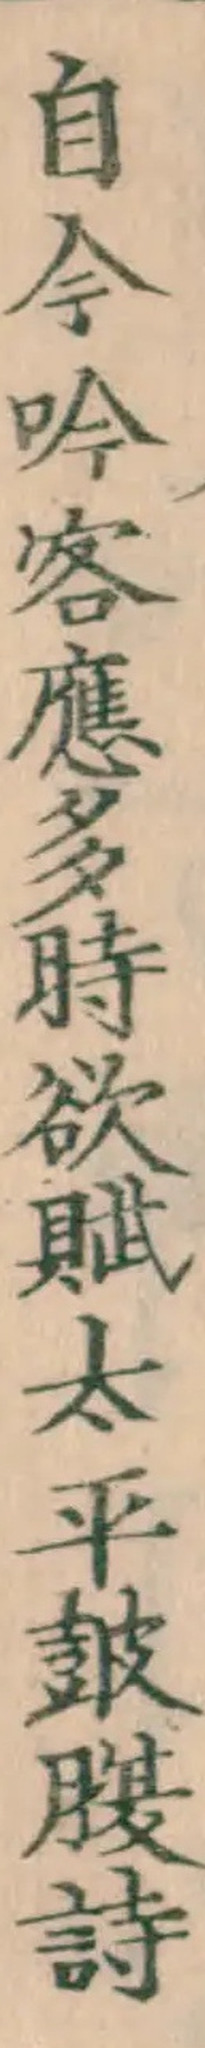自今吟客應多時欲賦太平鼓腹詩董斎
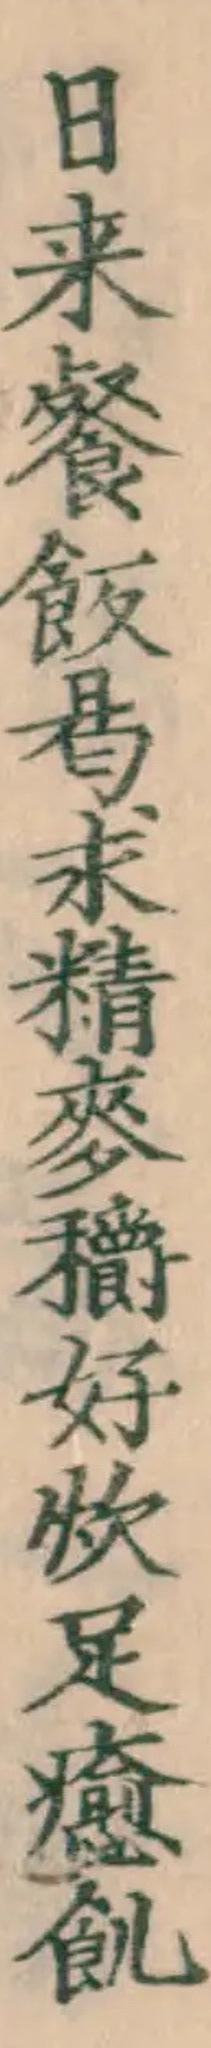日来餐飯曷求精麦穱好炊足癒飢䥫鶏
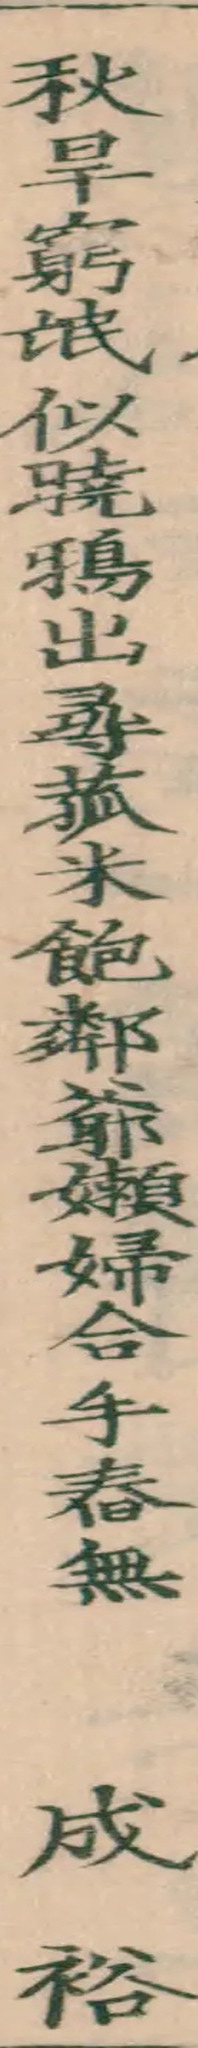秋旱窮氓似暁鴉出尋菰米飽隣爺嬾婦合手舂無成裕
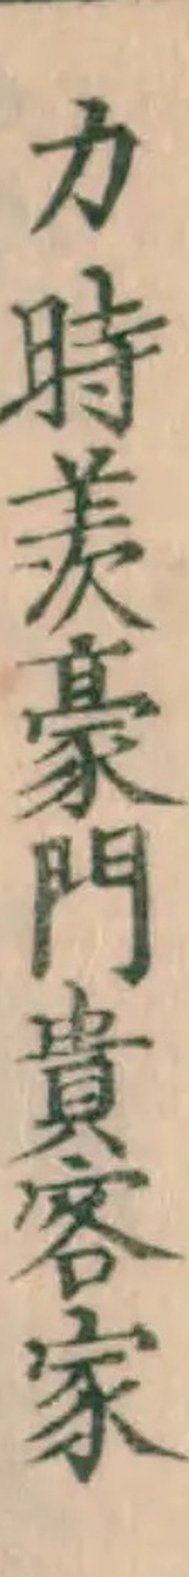力時羨豪門貴客家
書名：日ごとの心得
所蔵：国立国会図書館 National Diet Library, JAPAN
